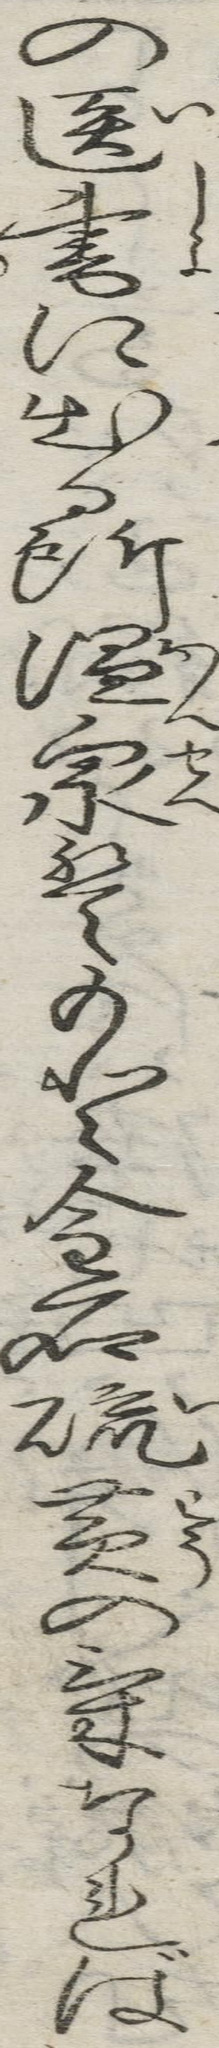の医書に出る所温泉はもと金石硫黄の気なれば
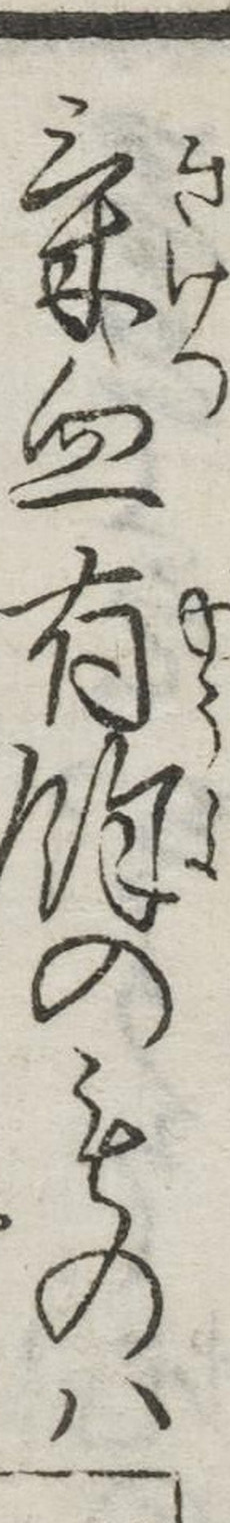気血有餘のものは
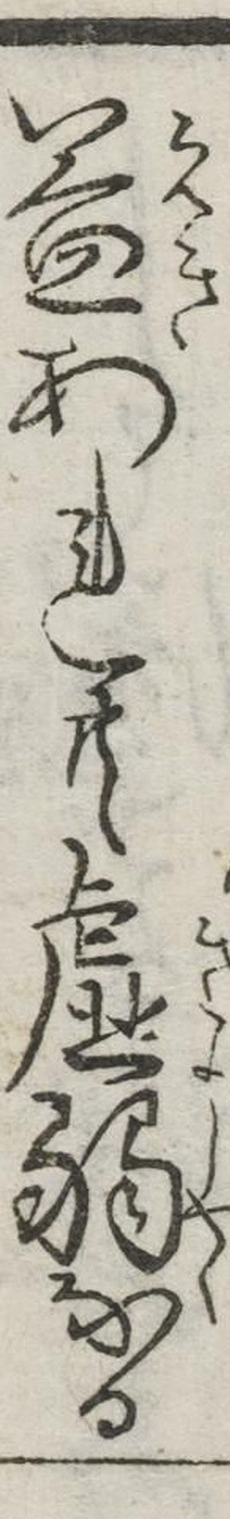益あれども虚弱なる
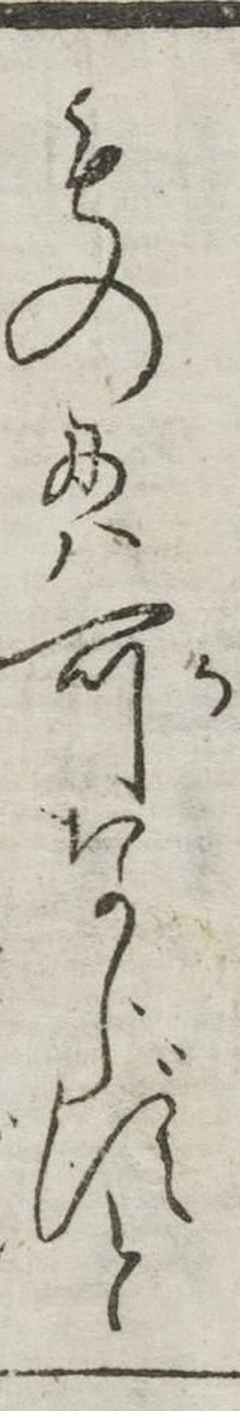もの共可ならずと
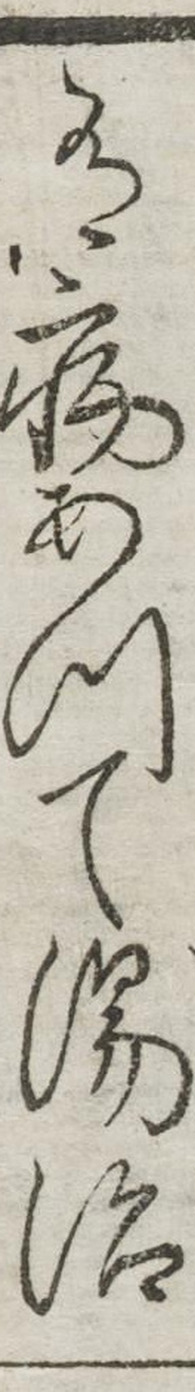有は病あつて湯治
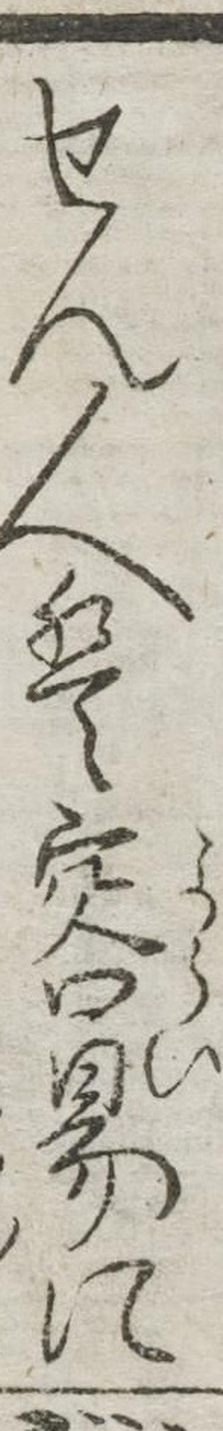せん人は容易に
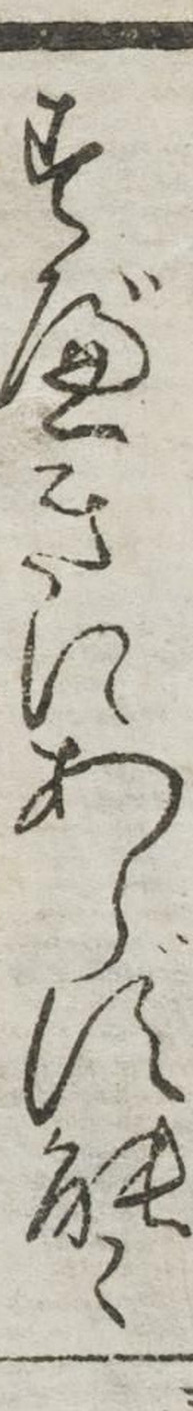すべきにあらす能ゝ
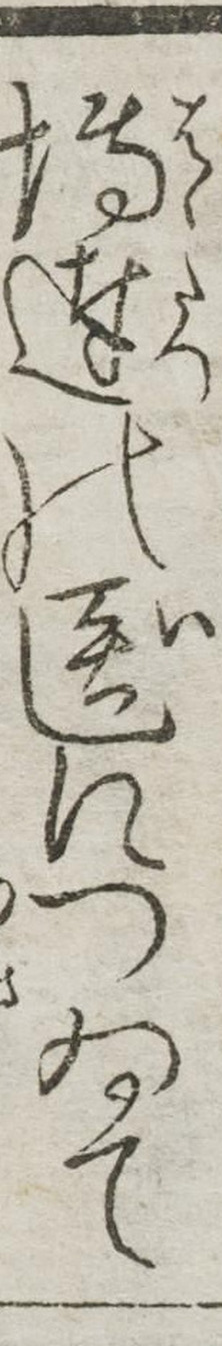博達の医について
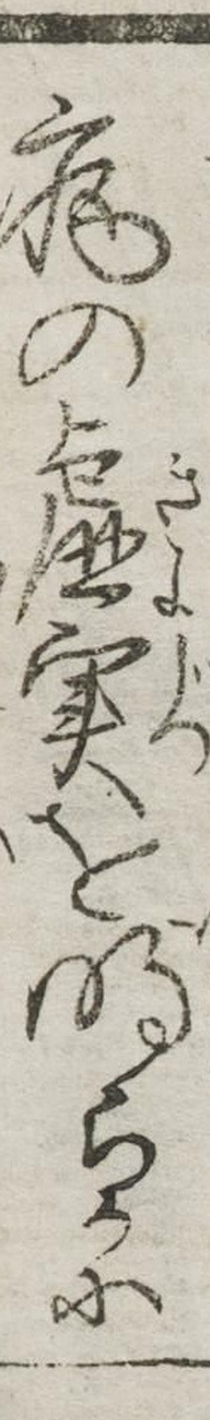病の虚実を明らかに
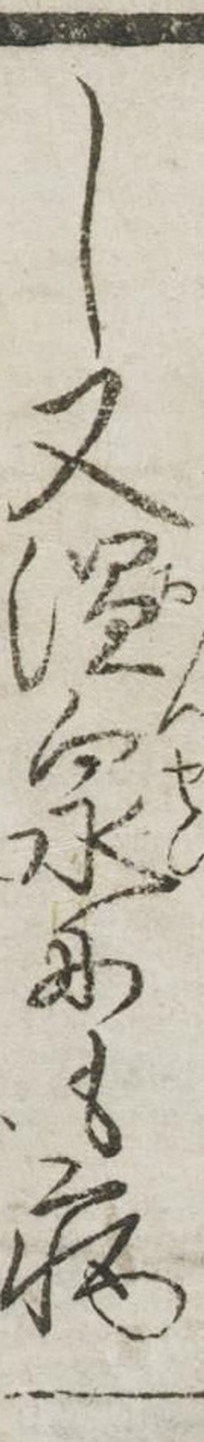し又温泉にも病
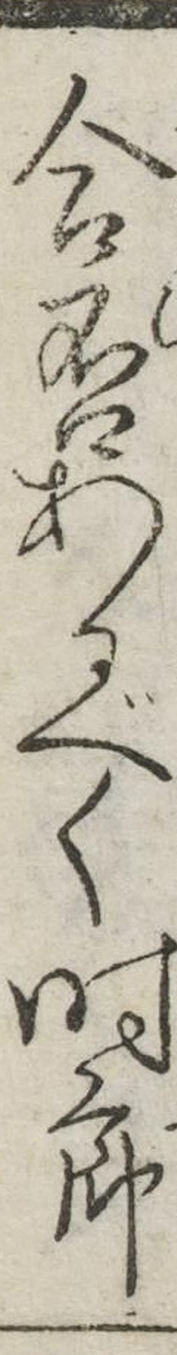合否あるべく時節

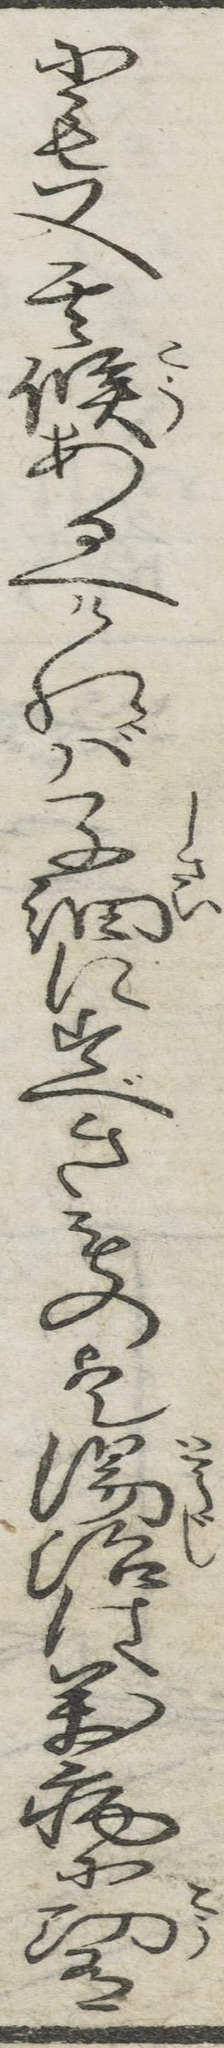にも又其候あるへければ子細にすべきもの是湯治はみ病に功有
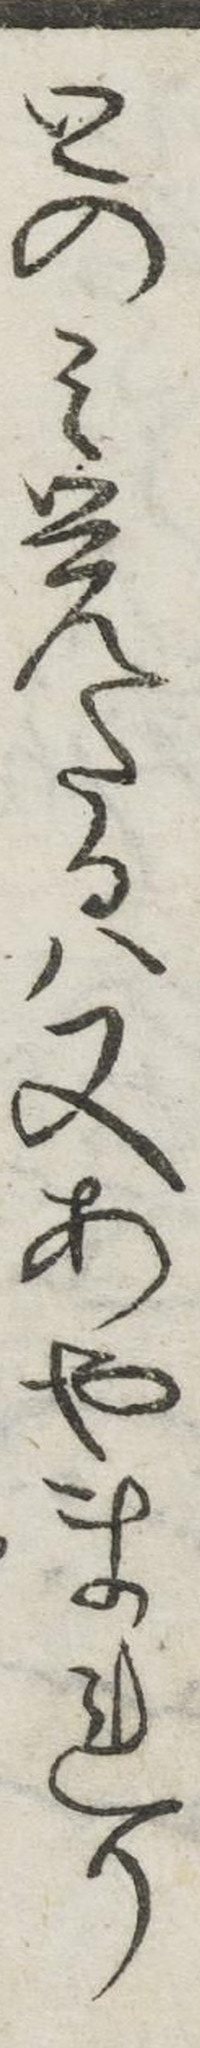とのみ答たるは又あやまれり
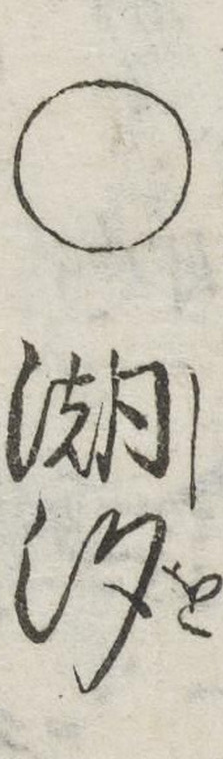○潮汐
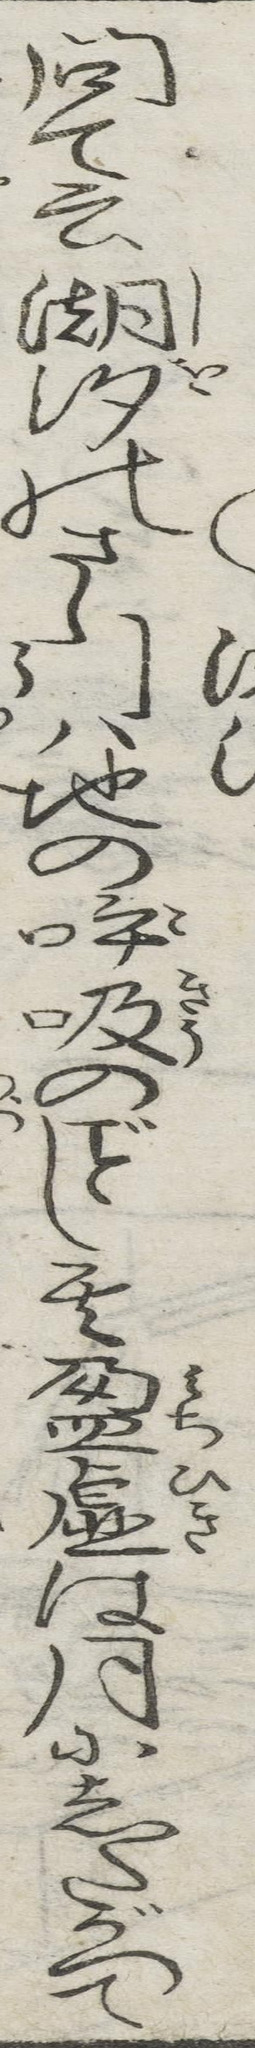問て云潮汐のさし引は地の呼吸のごとし其盈虚は月にしたがつて
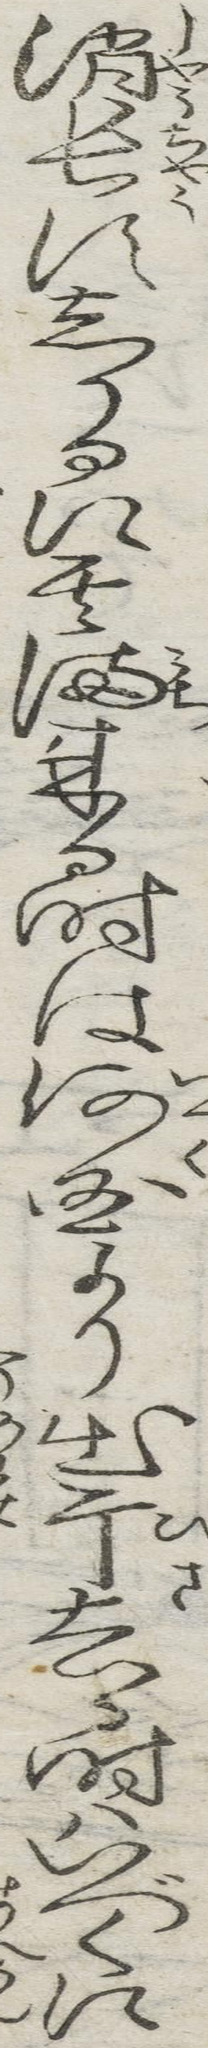消長すしかるに其満来る時は何国より出干去る時はいづくに
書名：訓蒙天地辨　地
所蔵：東京大学地震研究所図書室 Earthquake Research Institute Library, The University of Tokyo, JAPAN
